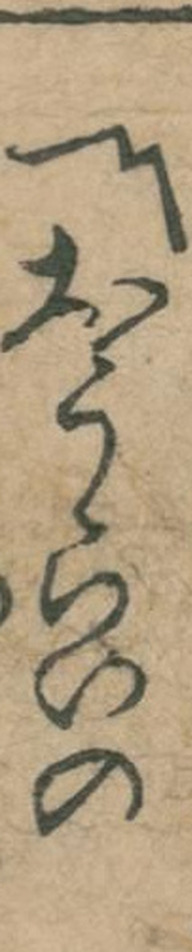〽おうらいの
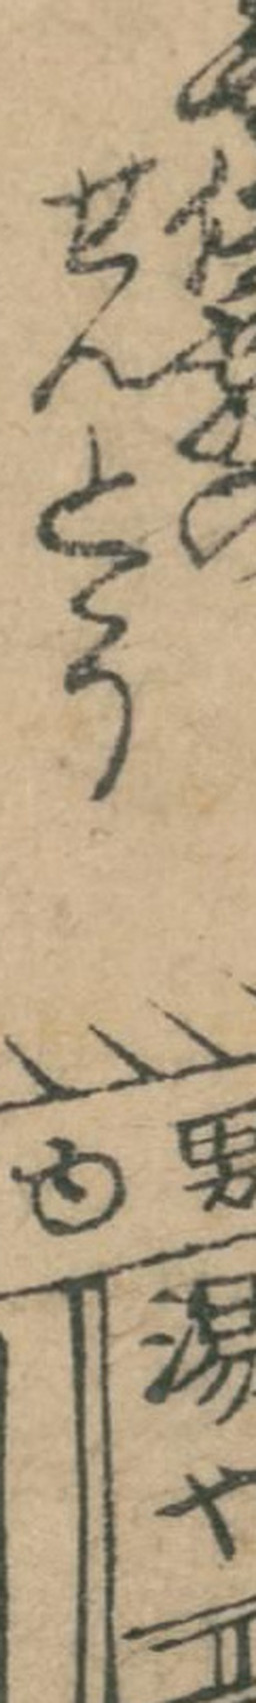せんとう
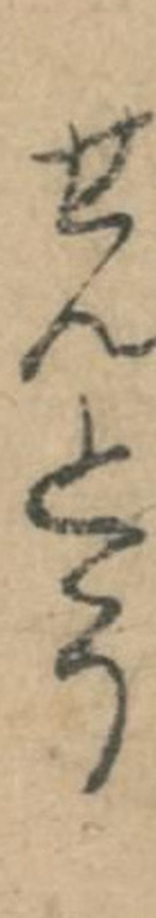せんとう
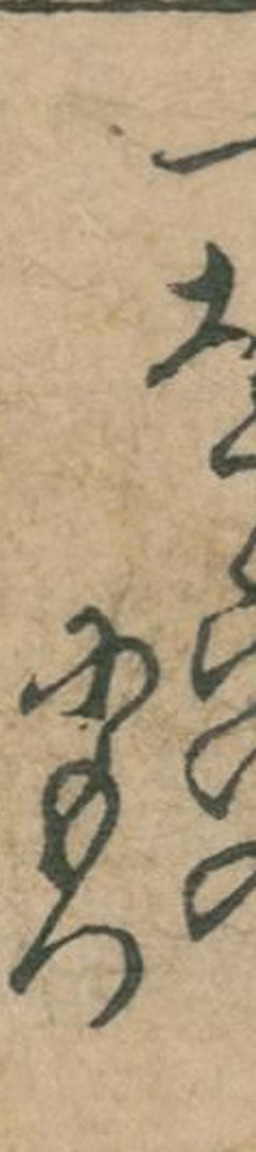にもつ
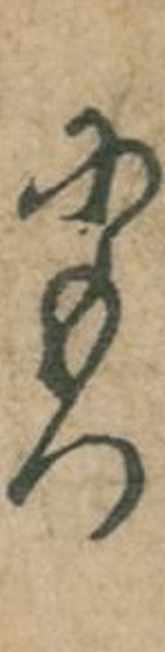にもつ
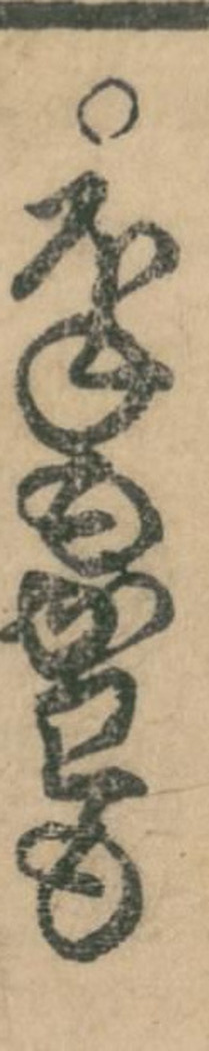◯ほねもかわも
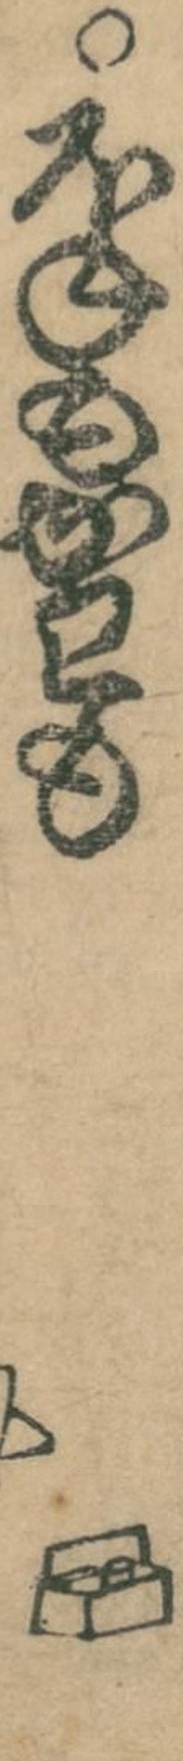◯ほねもかわも
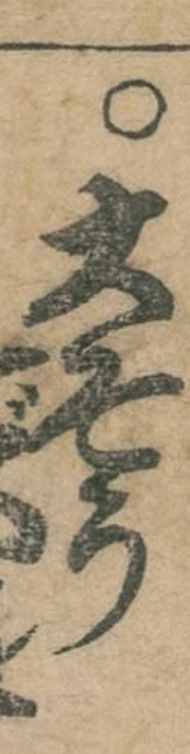◯大そう
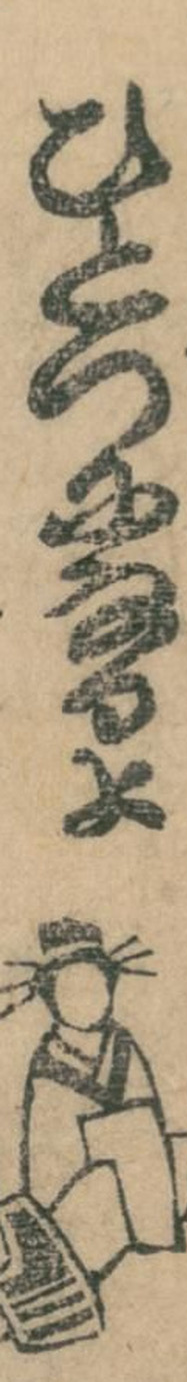ひとつになるよ
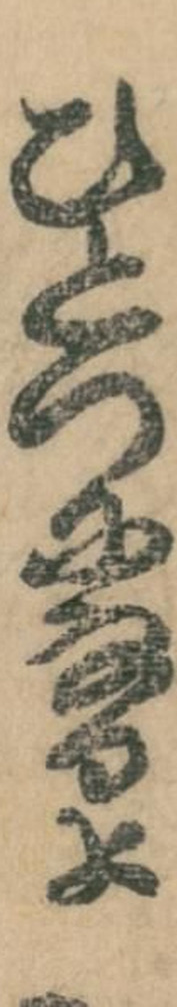ひとつになるよ
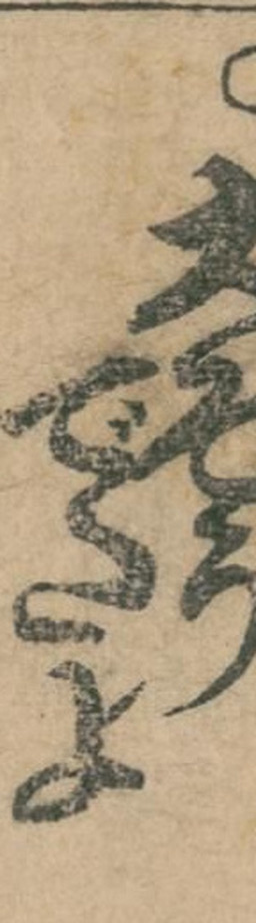でたよ
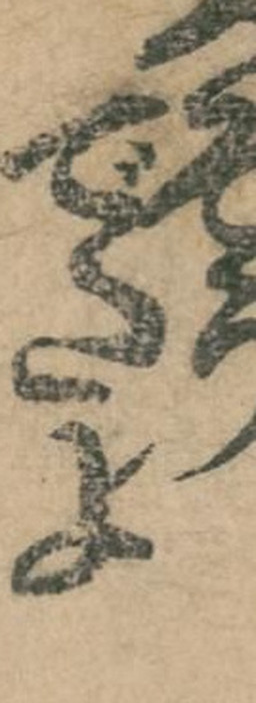でたよ
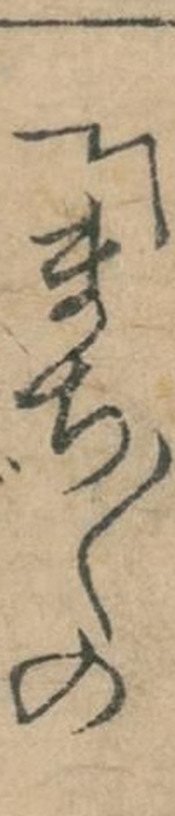〽まち〳〵の
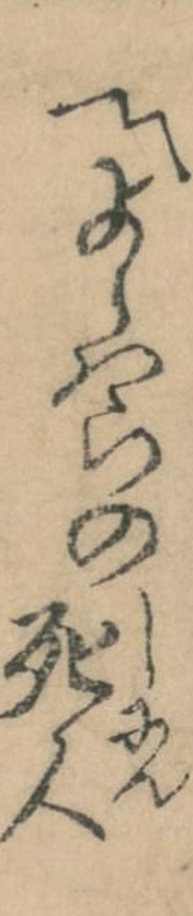〽よしはらの死人
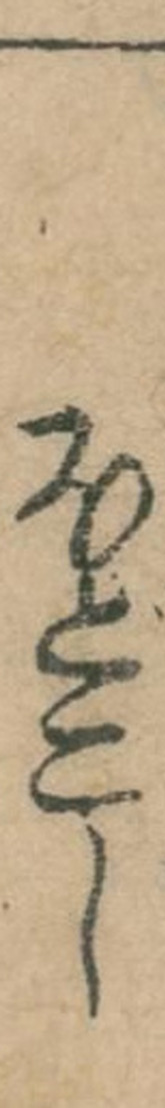ほどこし
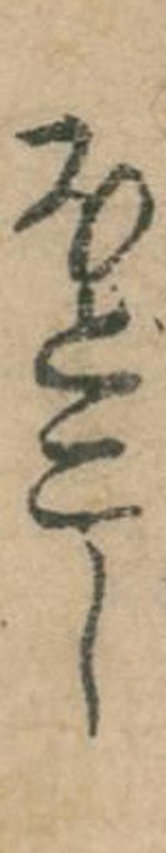ほどこし
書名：地震出火　例のおわらひ
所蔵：東京大学地震研究所図書室 Earthquake Research Institute Library, The University of Tokyo, JAPAN
